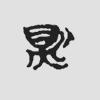則
